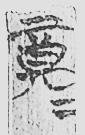奠=
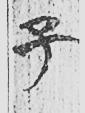子
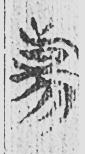{㫃昜}
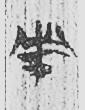用
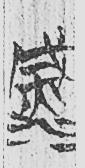滅
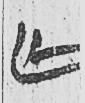亡
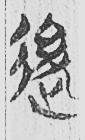後
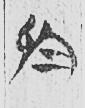於
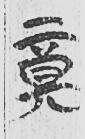奠
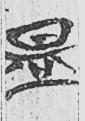昷
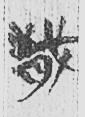歲
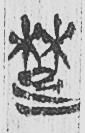楚
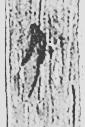人
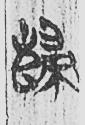{𡴎帚}
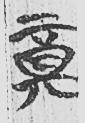奠
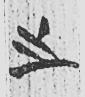之
